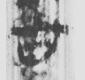古
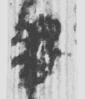卲
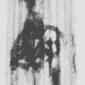龜
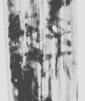鰥
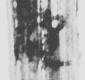祀
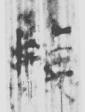{示厇}
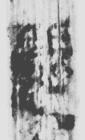禳
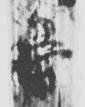祈
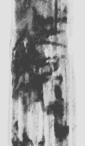{來右示}
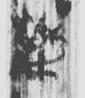{水禾牛}
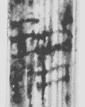珪
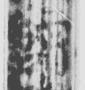辟
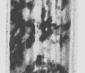我
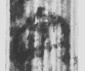全
